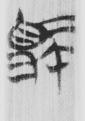{馬午}
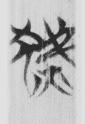{犬弟火}
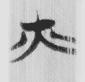火
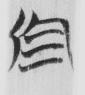於
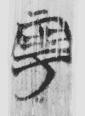𩁹
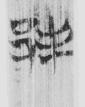邦
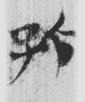孤
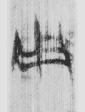用
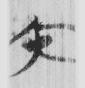內
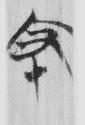守
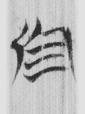於
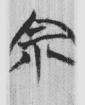宗
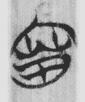{宀苗}
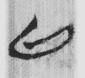㠯（以）
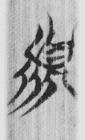須
